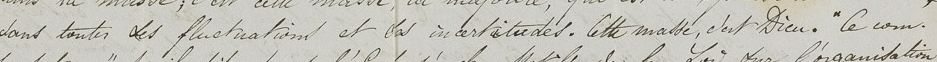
dans toutes ses fluctuations et ses incertitudes. Cette masse, c'est Dieu. «Ce com-
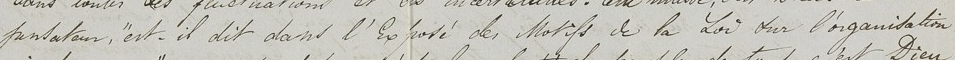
pensateur», est-il dit dans l'Exposé des Motifs de la Loi sur l'organisation
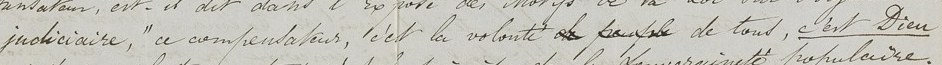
judiciaire, «ce compensateur, c'est la volonté du peuple de tous, c'est Dieu
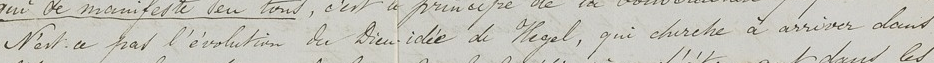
N'est-ce pas l'évolution du Dieu-idée de Hegel, qui cherche à arriver dans
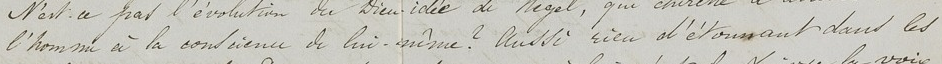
l'homme à la conscience de lui-même? Aussi rien d'étonnant dans les
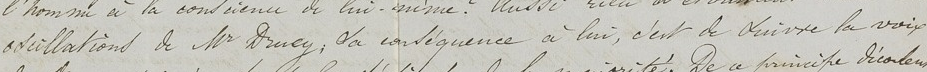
oscillations de MrDruey; sa conséquence à lui, c'est de suivre la voix
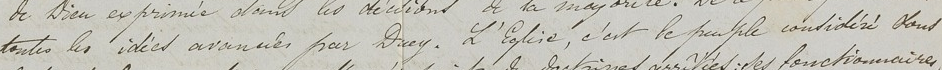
toutes les idées avancées par Druey. L'Eglise, c'est le peuple considéré sous
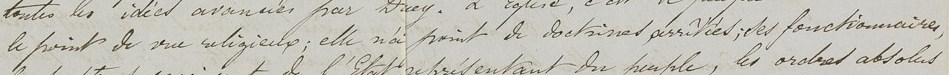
le point de vue religieux; elle n'a point de doctrines arrêtées; ses fonctionnaires,
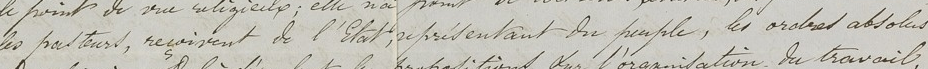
les pasteurs, reçoivent de l'Etat, représentant du peuple, les ordres absolus
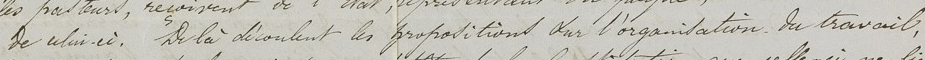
de celui-ci. De là découlent les propositions sur l'organisation du travail,
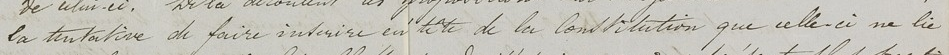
la tentative de faire inscrire en tête de la Constitution que celle-ci ne lie
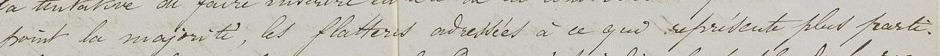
point la majorité, les flatteries adressées à ce qui représente plus parti-
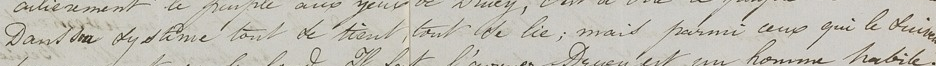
Dans son système tout se tient, tout se lie; mais parmi ceux qui le suivent,
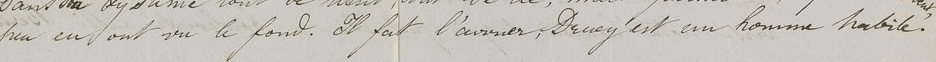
peu en ont vu le fond. Il faut l'avouer, Druey est un homme habile.
